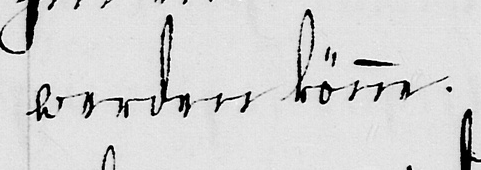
werden könne.
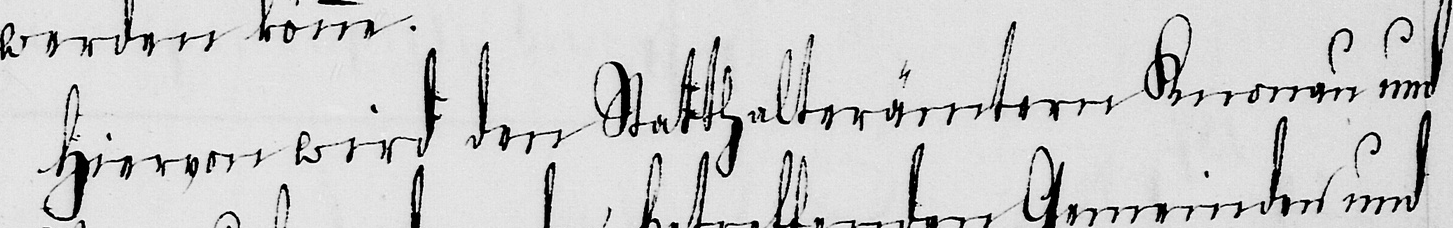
Hiervon wird den Statthalterämtern Knonau und
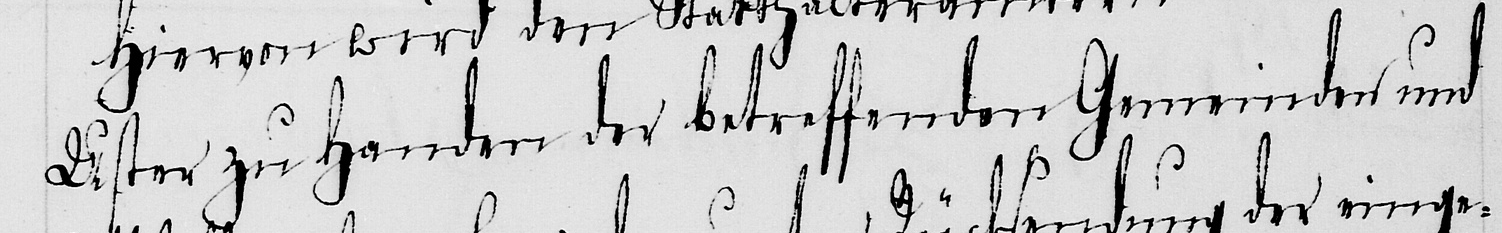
Uster zu Handen der betreffenden Gemeinden und
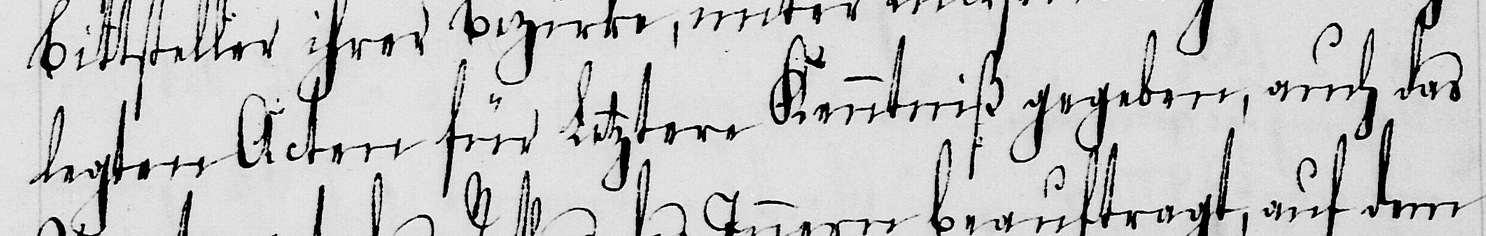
legten Acten für Letztere Kenntniß gegeben, auch das
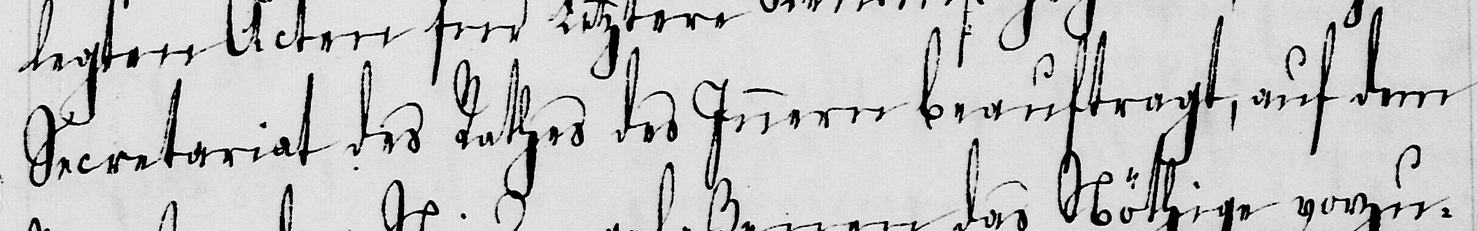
Secretariat des Rathes des Innern beauftragt, auf dem
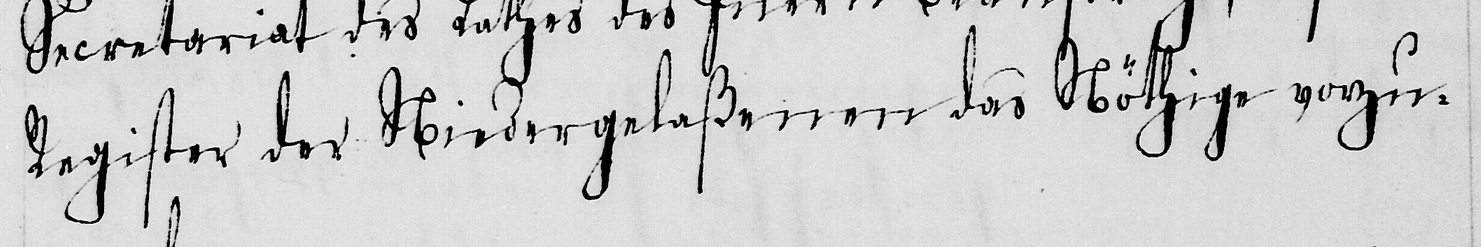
Register der Niedergelaßenen das Nöthige vorzu¬
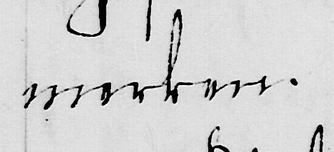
merken.
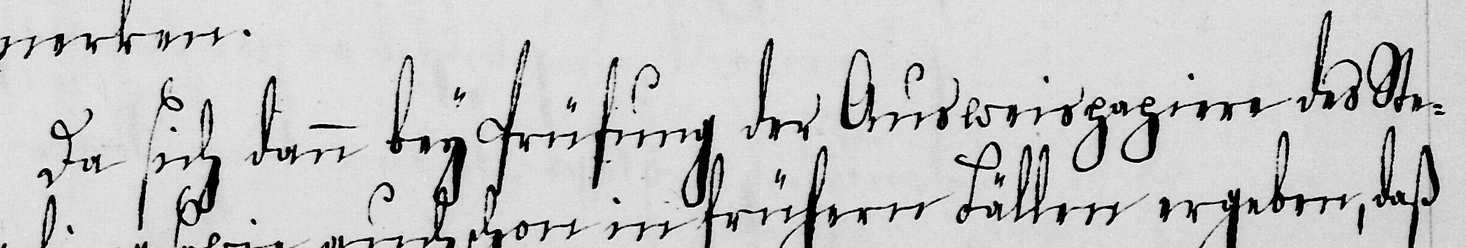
Da sich dann bey Prüfung der Ausweispapiere des St¬
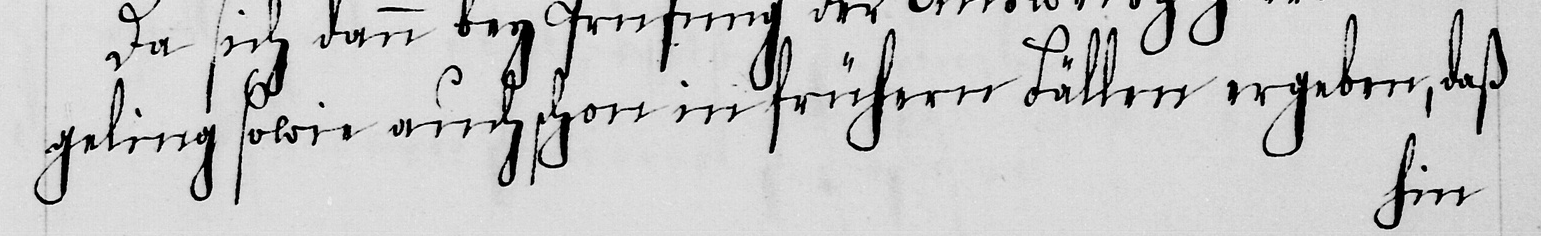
egeling sowie auch schon in frühern Fällen ergeben, daß
